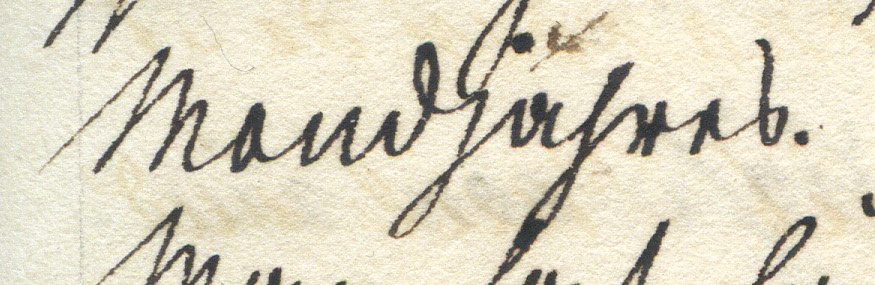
Mondjahres.
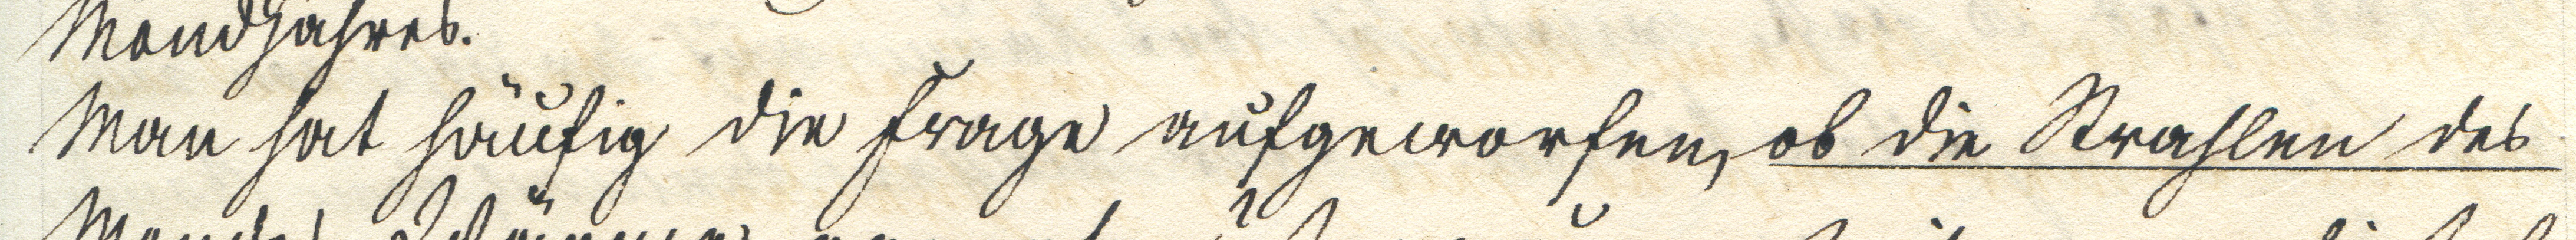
Man hat häufig die Frage aufgeworfen, ob die Strahlen des
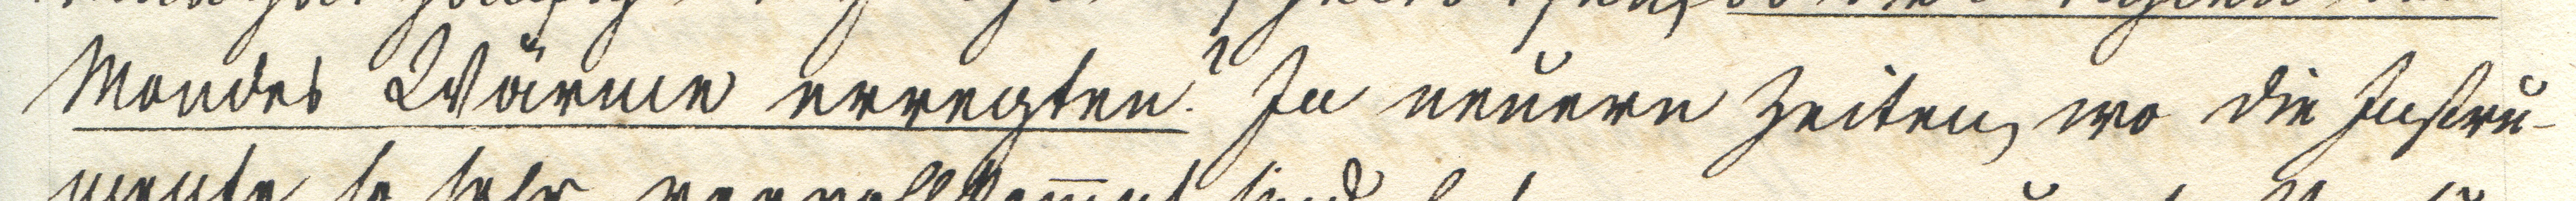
Mondes Wärme erregten? In neuern Zeiten, wo die Instru-
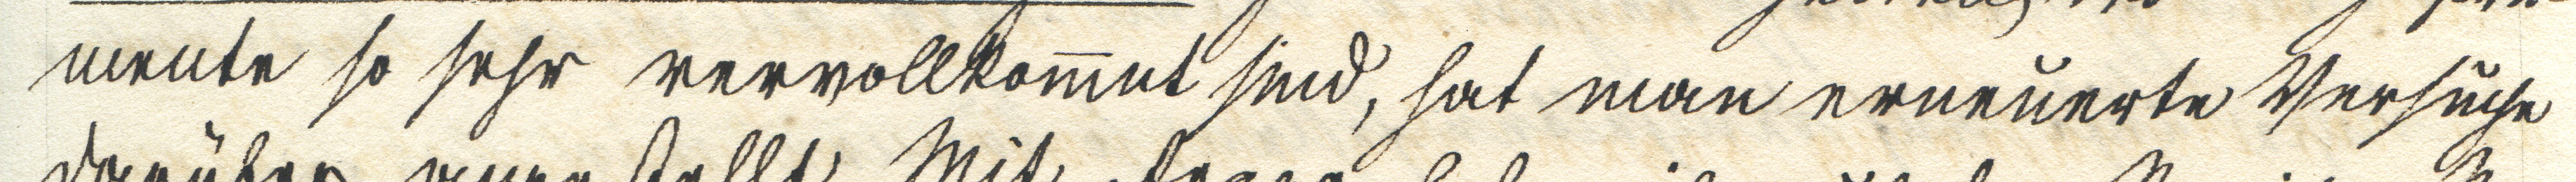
mente so sehr vervollkom̃et sind, hat man erneuerte Versuche
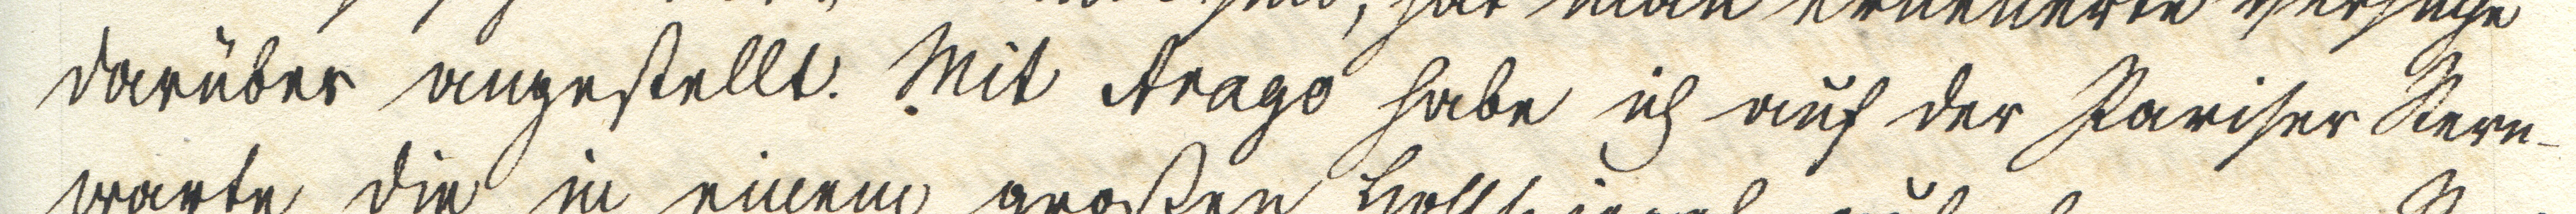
darüber angestellt. Mit Arago habe ich auf der Pariser Stern-
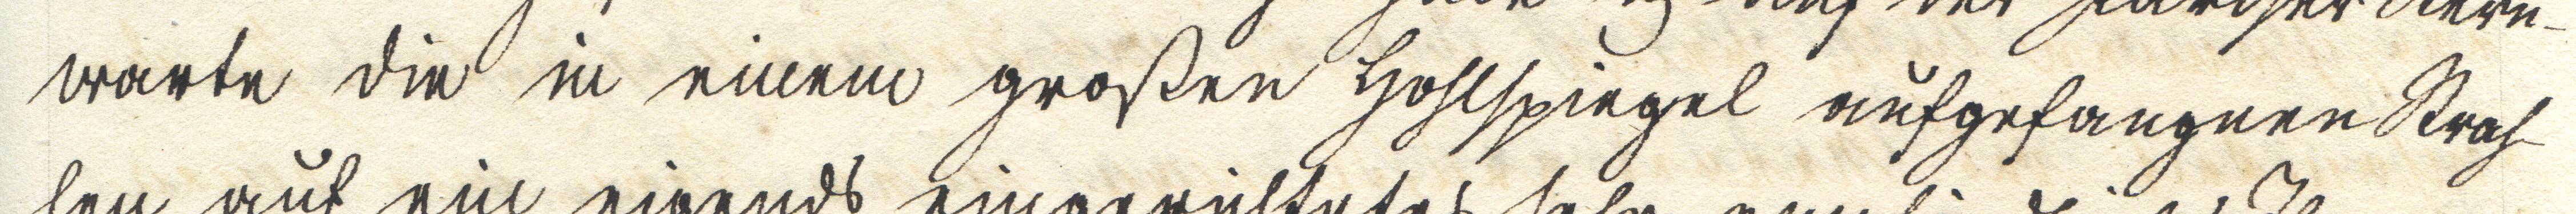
warte die in einem großen Hohlspiegel aufgefangenen Strah-
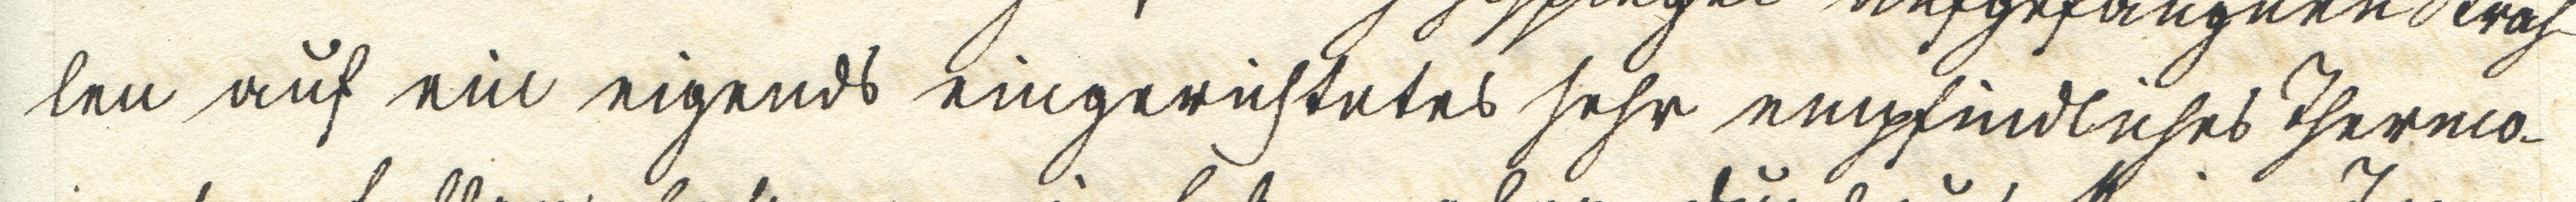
len auf ein eigends eingerichtetes sehr empfindliches Thermo-
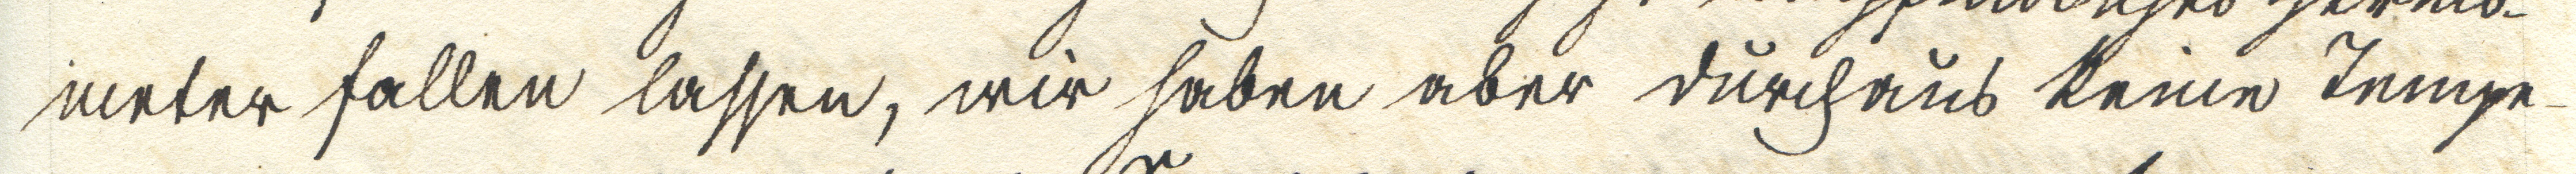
meter fallen lassen, wir haben aber durchaus keine Tempe-
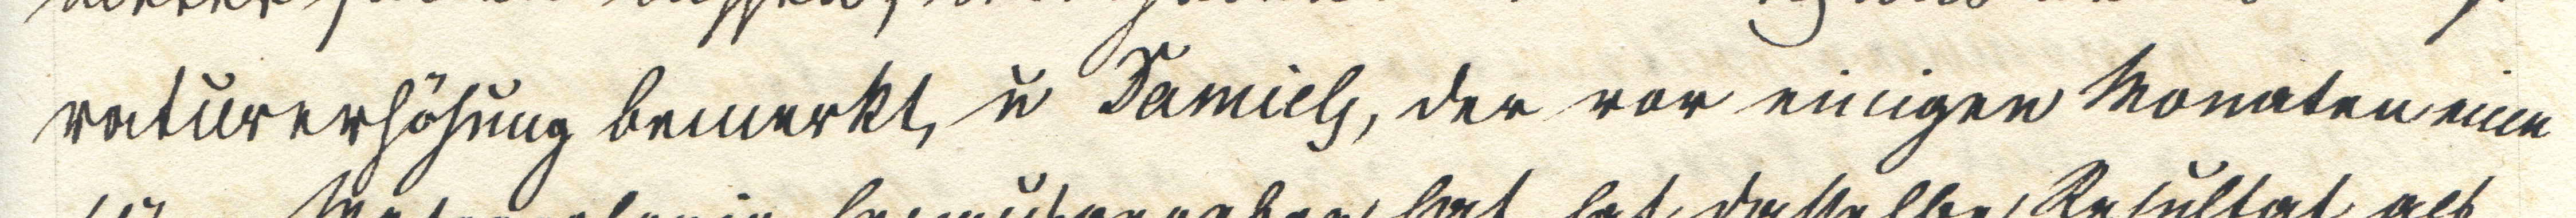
raturerhöhung bemerkt, u Damiels, der vor einigen Monaten eine
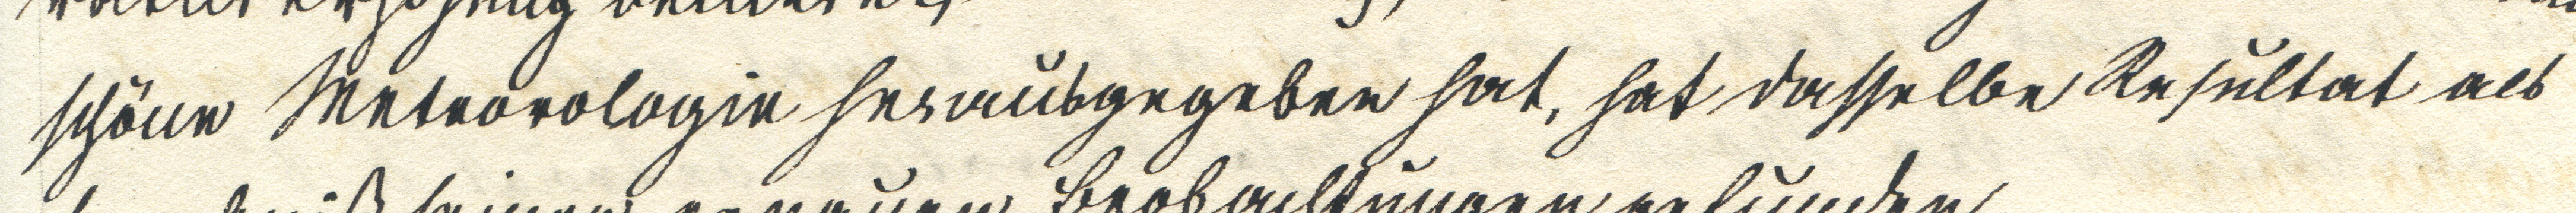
schöne Meteorologie herausgegeben hat, hat dasselbe Resultat als
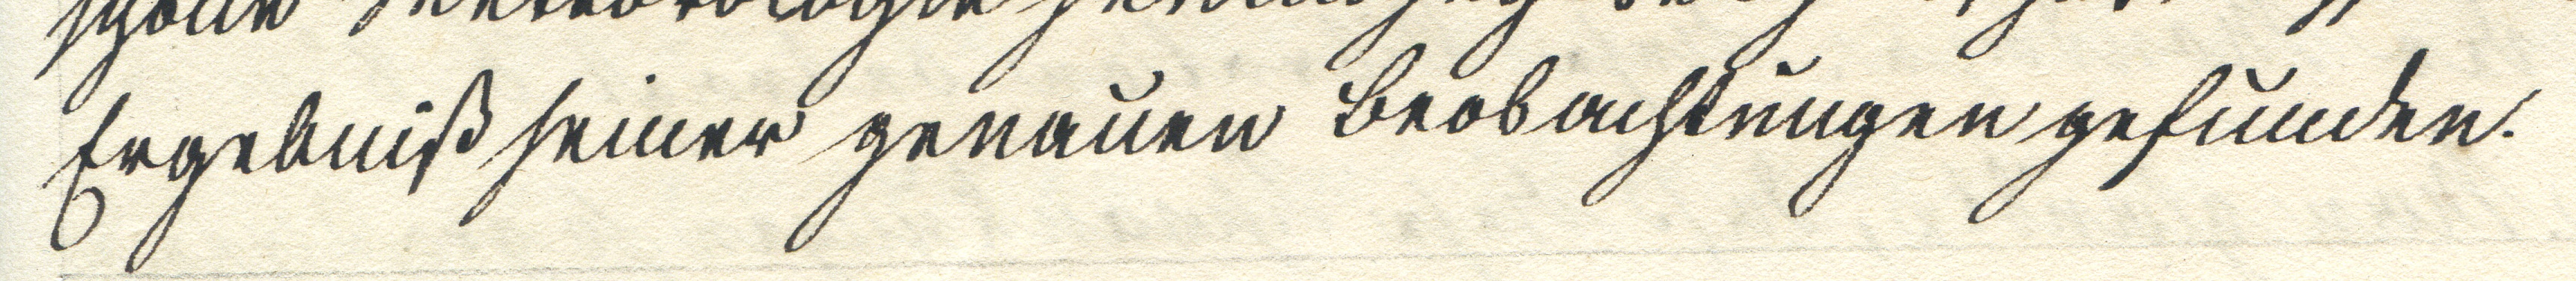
Ergebniß seiner genauen Beobachtungen gefunden.
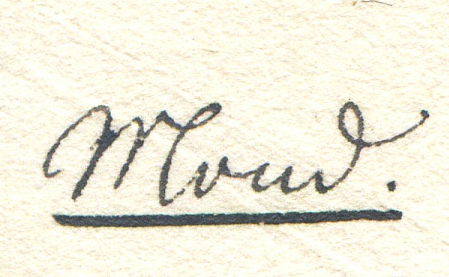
Stande,
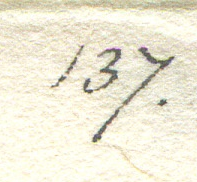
28″
